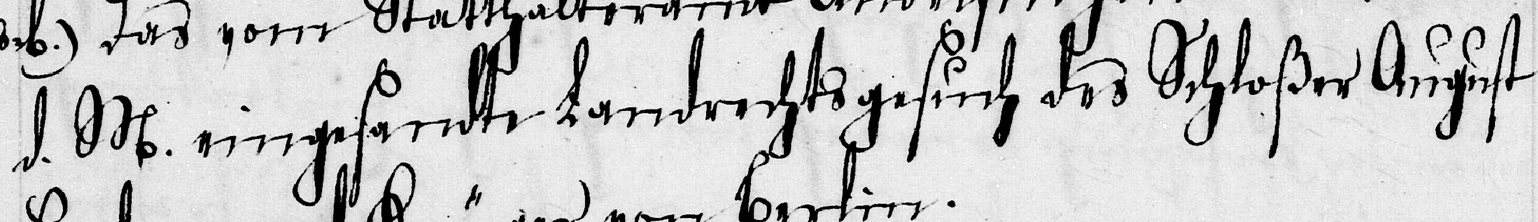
d. M. eingesandte Landrechtsgesuch des Schloßer August
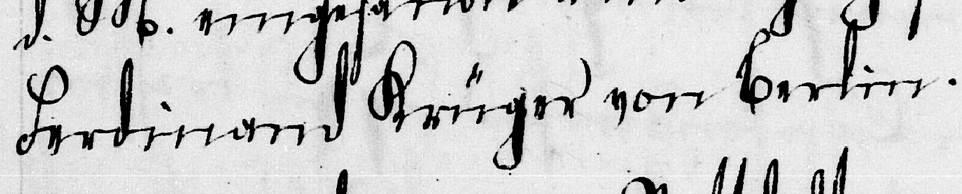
Ferdinand Krüger von Berlin.
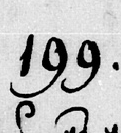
9. d.
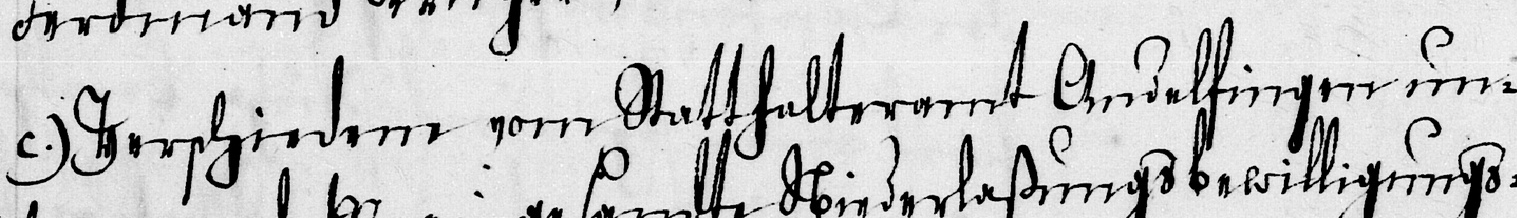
c.) Verschiedene vom Statthalteramt Andelfingen unt¬
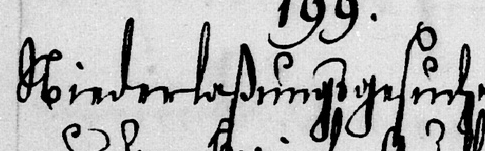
Niederlaßungsbewil¬
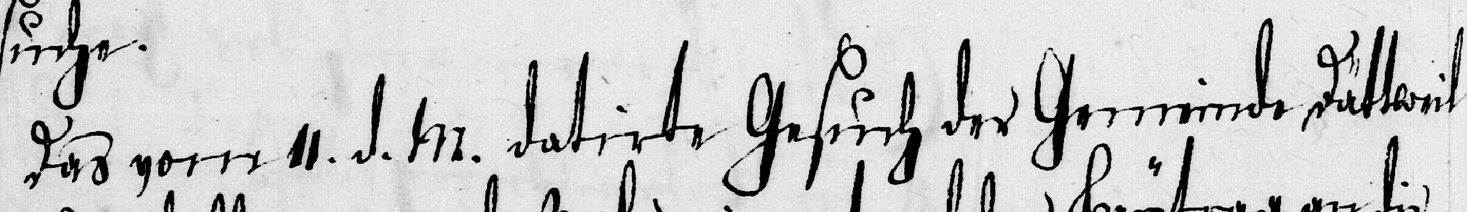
Das vom 11. d. M. datirte Gesuch der Gemeinde Dättweil
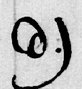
d.)
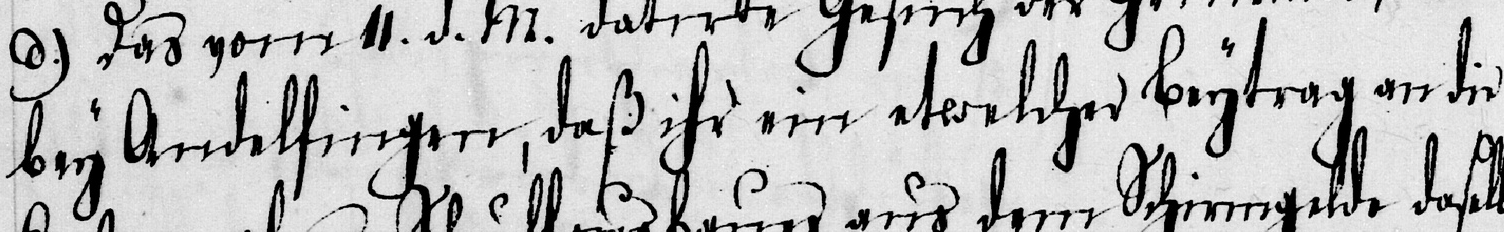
bey Andelfingen, daß ihr ein etwelcher Beytrag an die
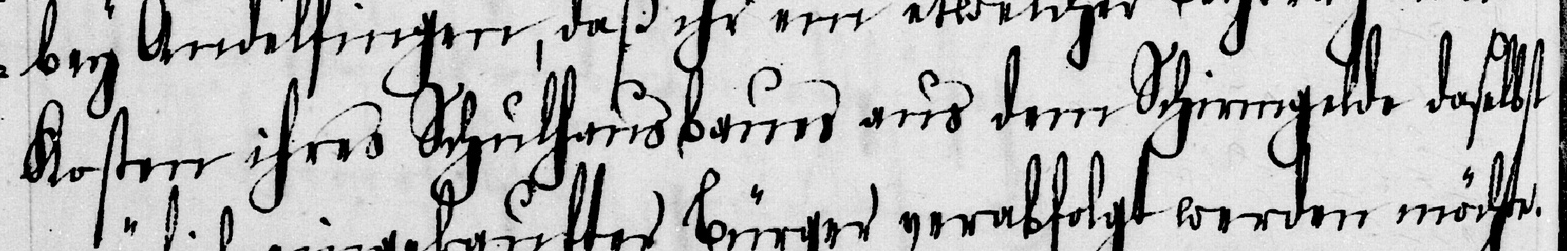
Kosten ihres Schulhausbaues aus dem Schirmgelde daselbst
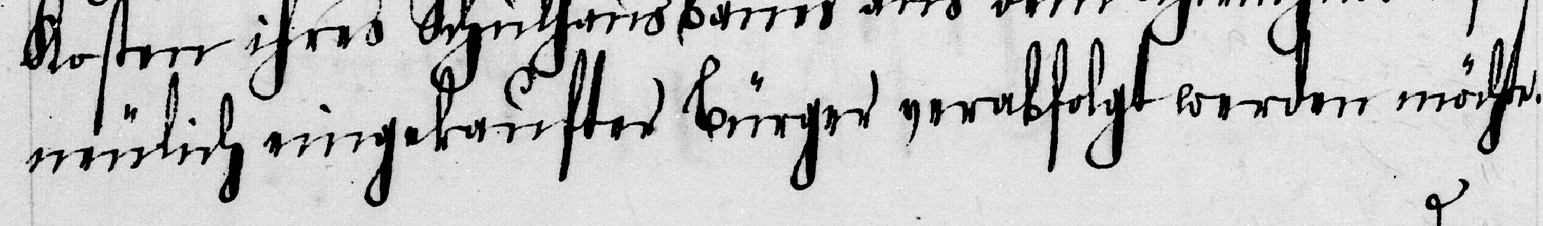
neulich eingekaufter Bürger verabfolgt werden möchte.
